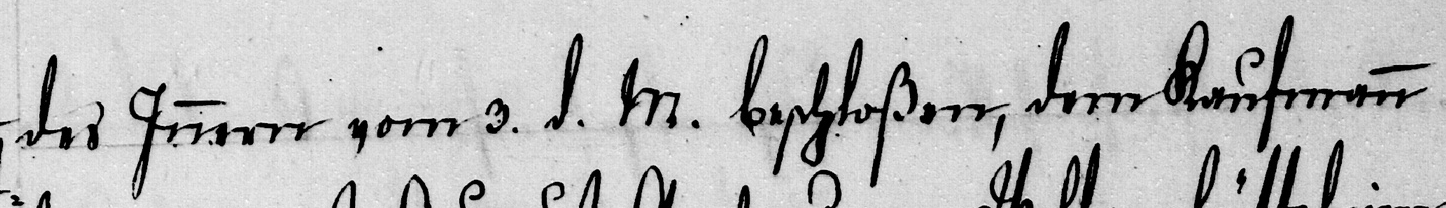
des Innern vom 3. d. M. beschloßen, dem Kaufmann
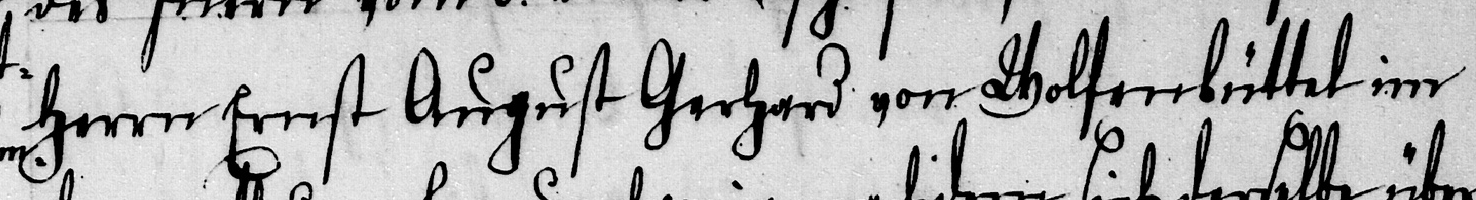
Herrn Ernst August Gerhard von Wolfenbüttel im
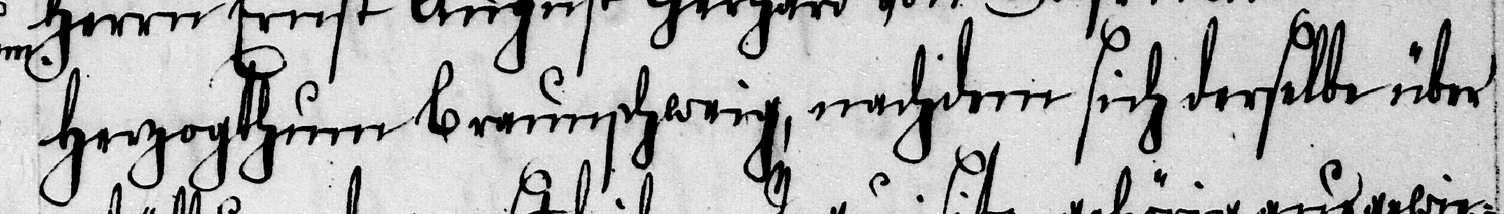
Herzogthum Braunschweig, nachdem sich derselbe über
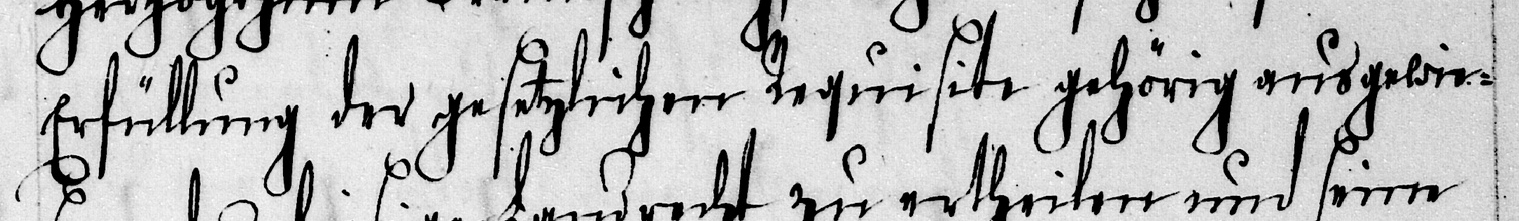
Erfüllung der gesetzlichen Requisite gehörig ausgewie¬
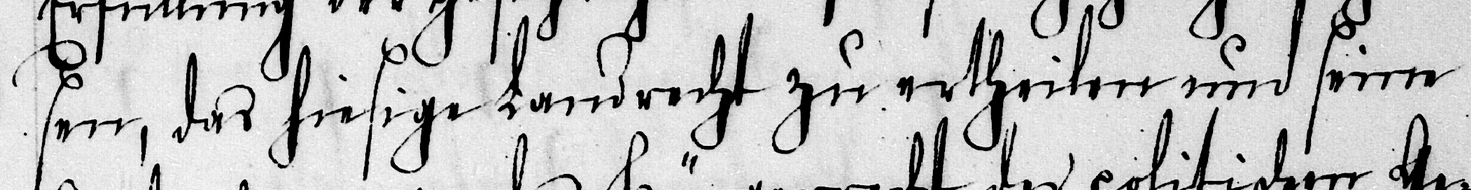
sen, das hiesige Landrecht zu ertheilen und seine
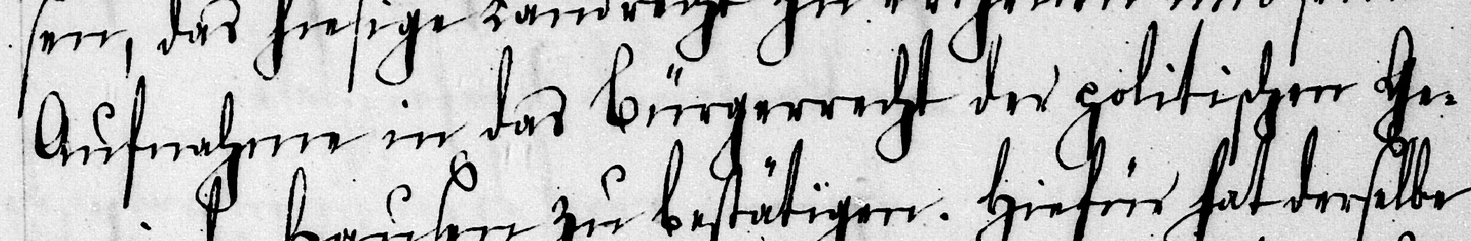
Aufnahme in das Bürgerrecht der politischen Ge¬
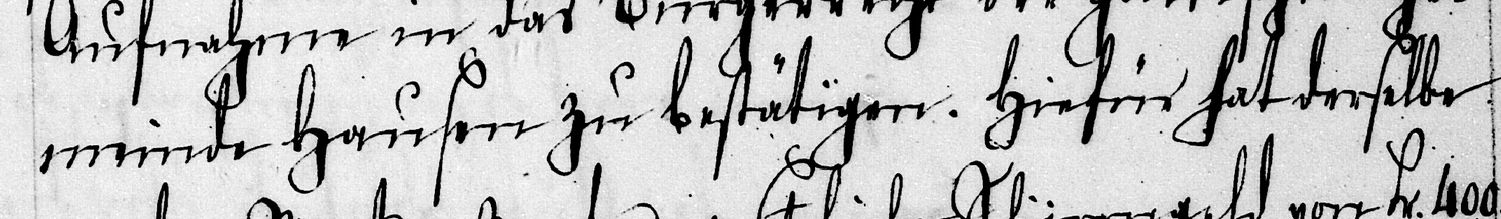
meinde Hausen zu bestätigen. Hiefür hat derselbe
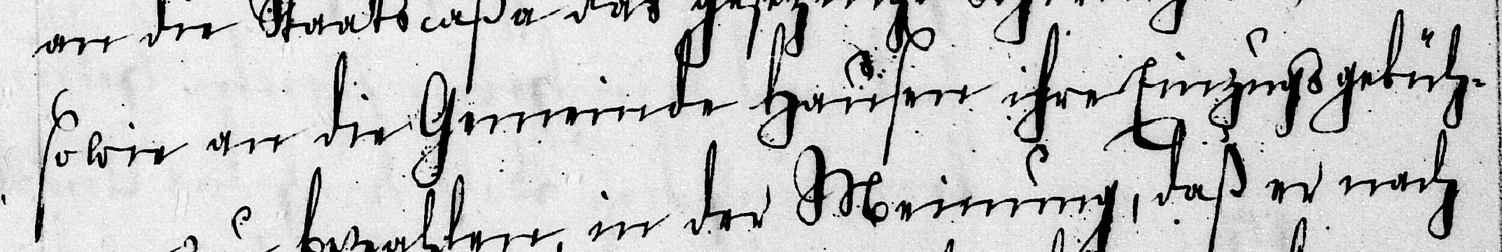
sowie an die Gemeinde Hausen ihre Einzugsgebüh¬
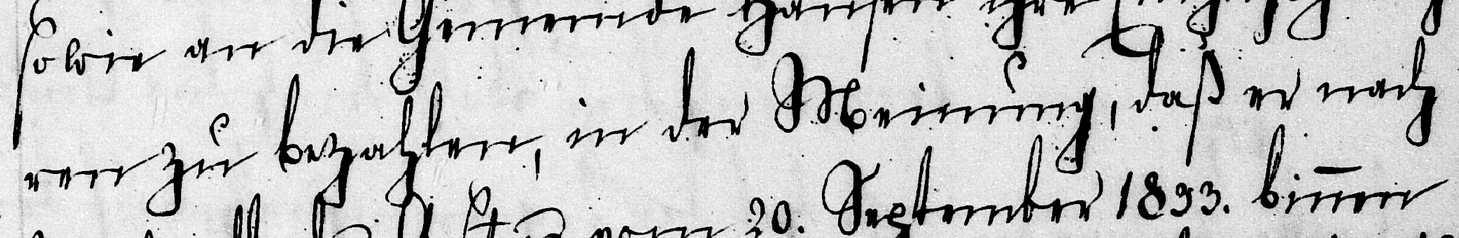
ren zu bezahlen, in der Meinung, daß er nach
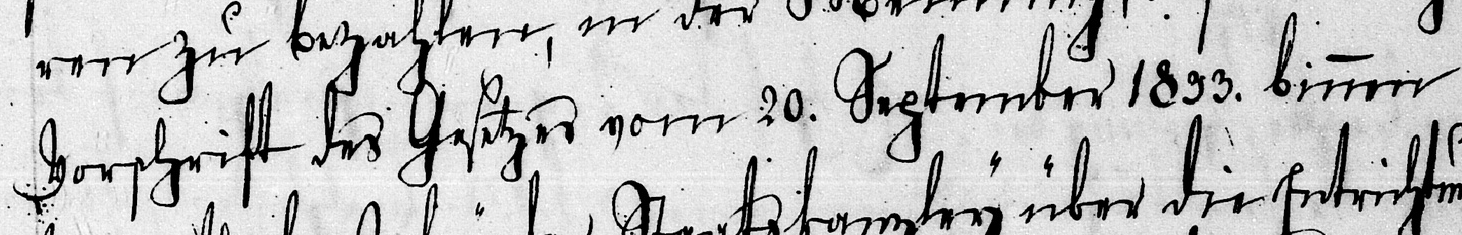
Vorschrift des Gesetzes vom 20. September 1833. binnen
